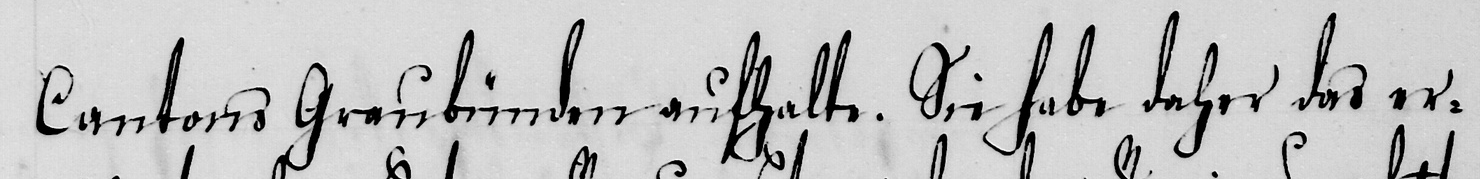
Cantons Graubünden aufhalte. Sie habe daher das er¬
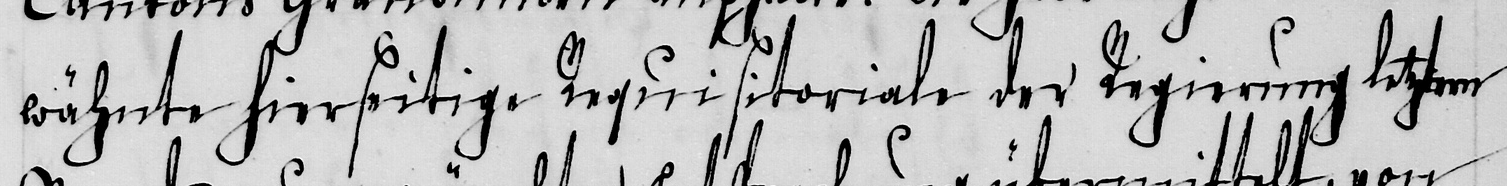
wähnte hierseitige Requisitoriale der Regierung letztern
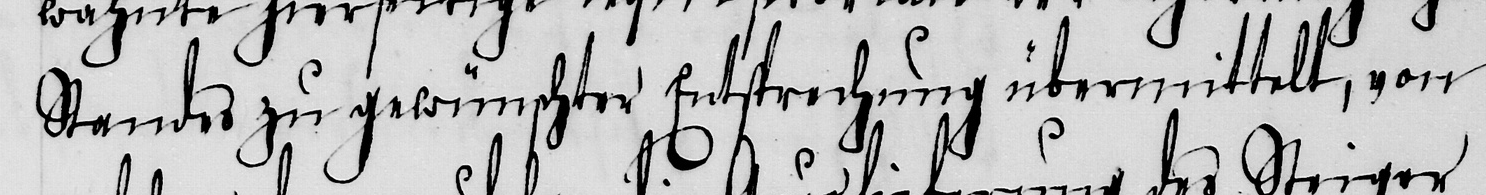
Standes zu gewünschter Entsprechung übermittelt, von
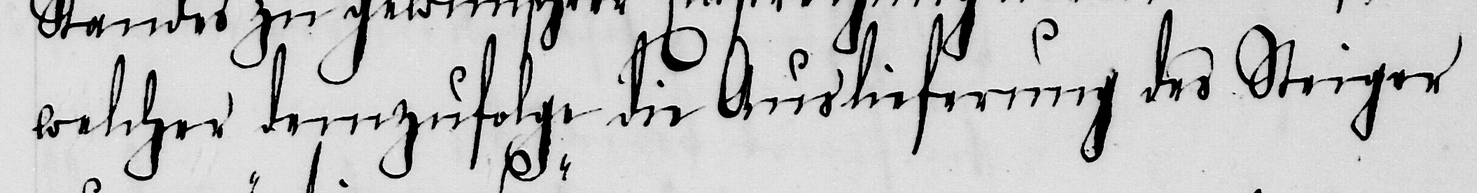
welcher demzufolge die Auslieferung des Steiger
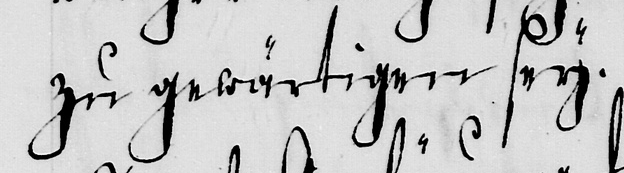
zu gewärtigen sey.
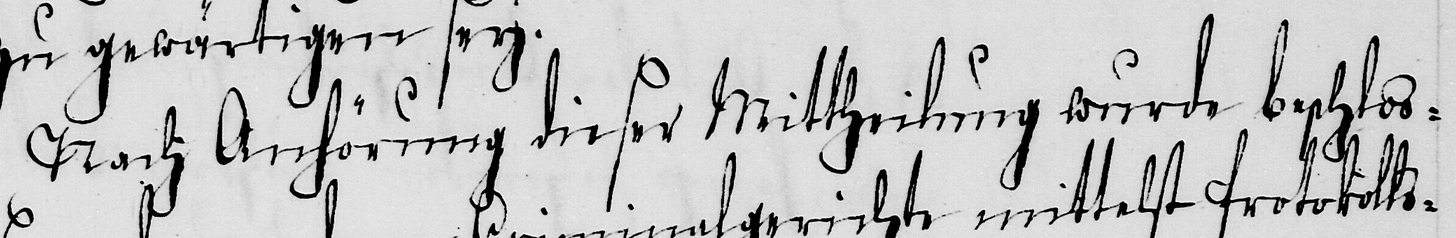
Nach Anhörung dieser Mittheilung wurde beschloß¬
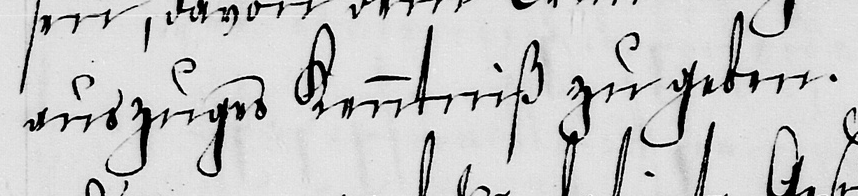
auszuges Kenntniß zu geben.
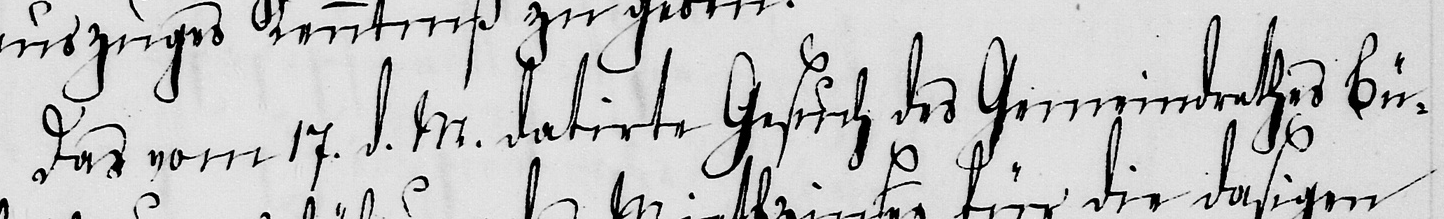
Das vom 17. d. M. datirte Gesuch des Gemeindrathes Bü¬
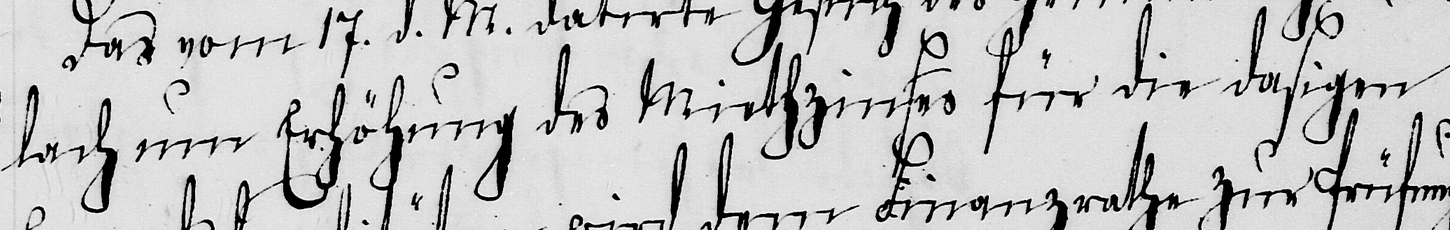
lach um Erhöhung des Miethzinses für die dasigen
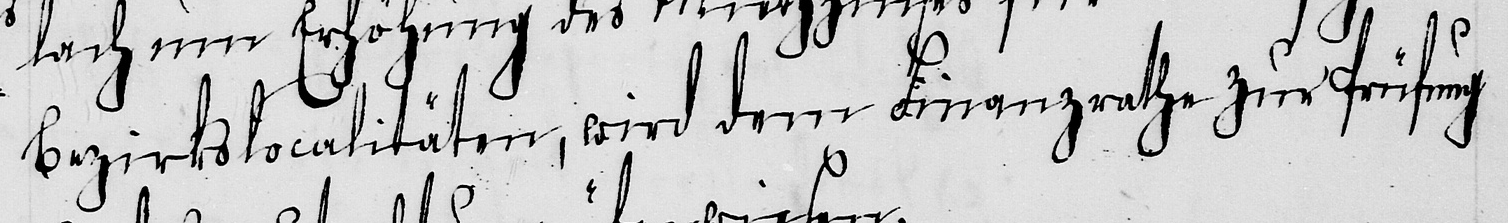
Bezirkslocalitäten, wird dem Finanzrathe zur Prüfung
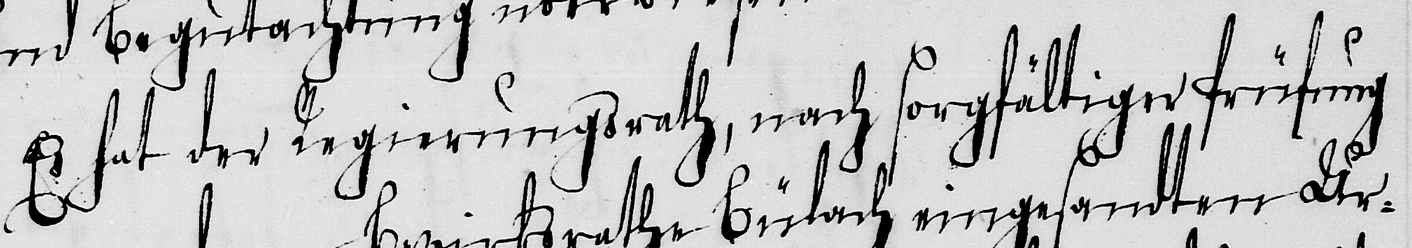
Es hat der Regierungsrath, nach sorgfältiger Prüfung
